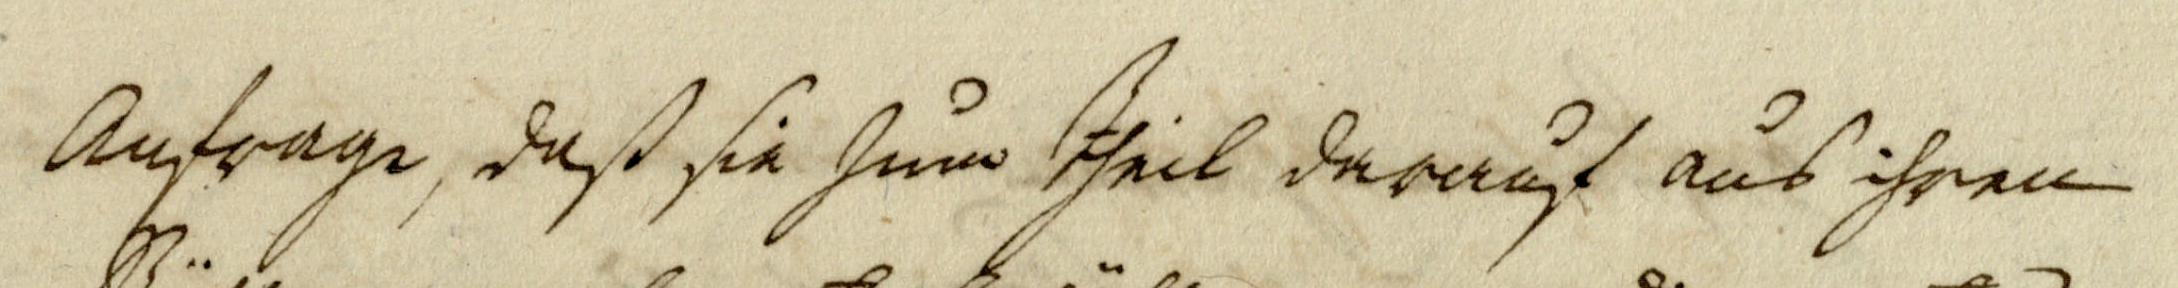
Anfrage, daß sie zum Theil darauf aus ihren
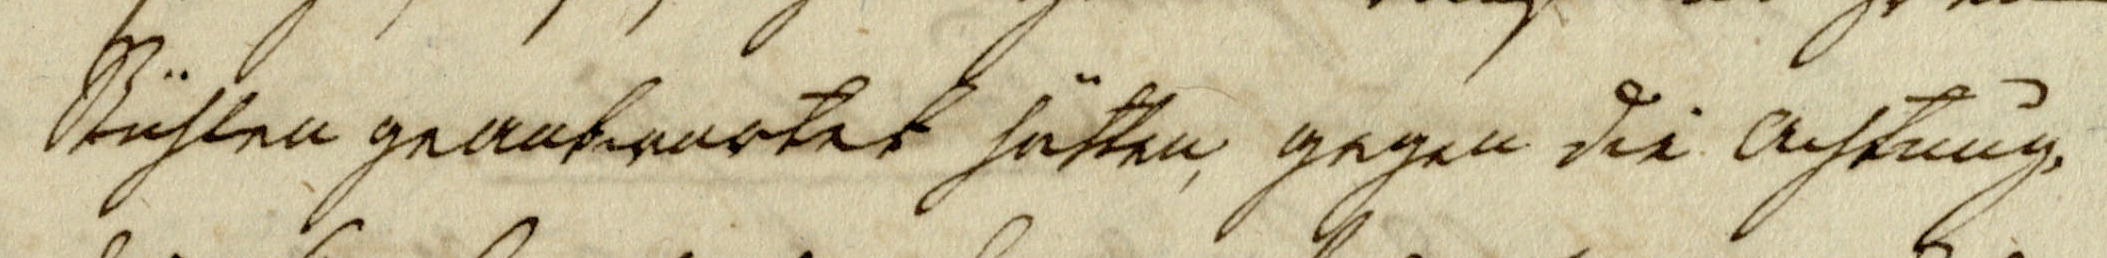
Stühlen geantwortet hätten, gegen die Achtung,
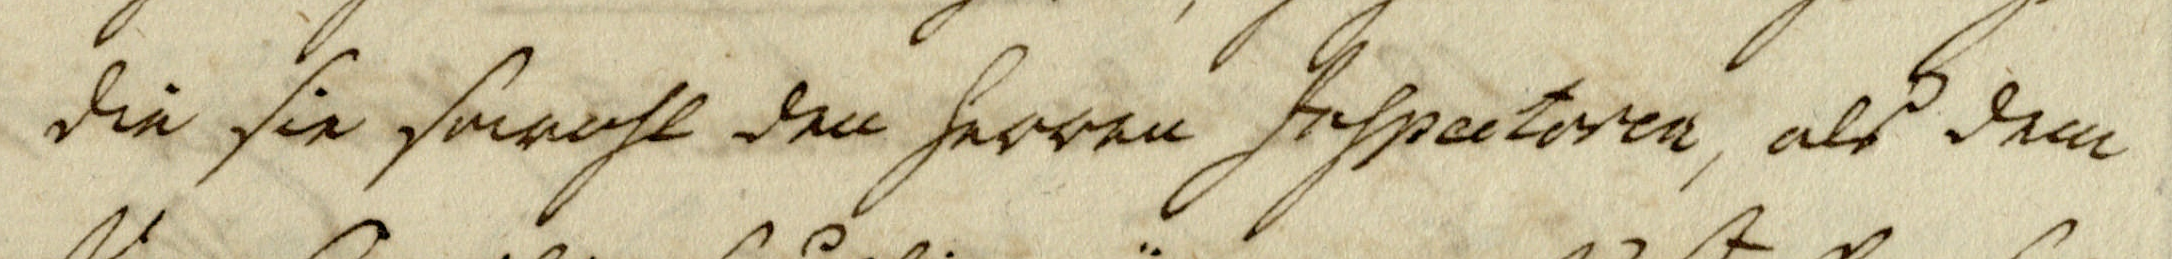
die sie sowohl den Herren Inspectoren, als dem
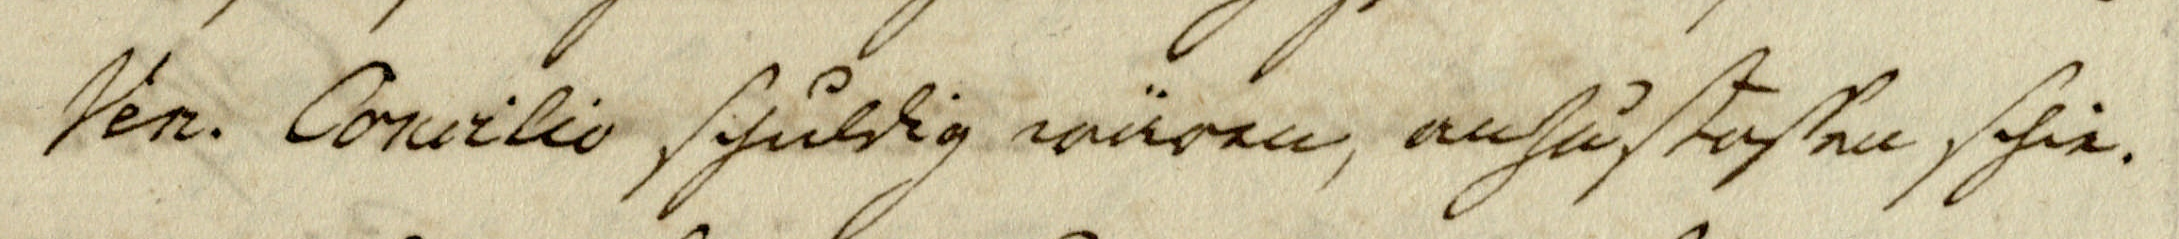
Ven. Concilio schuldig wären, anzustossen schie¬
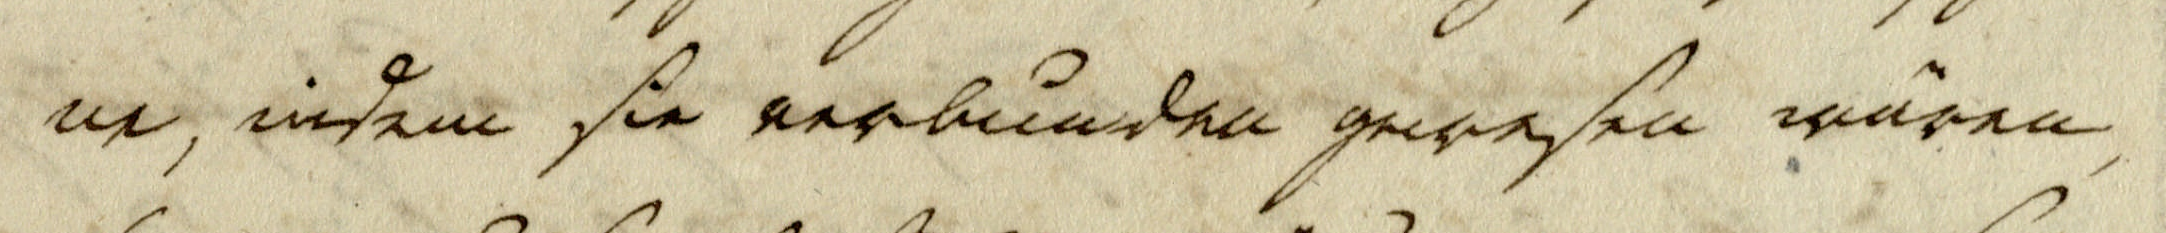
ne, indem sie verbunden gewesen wären,
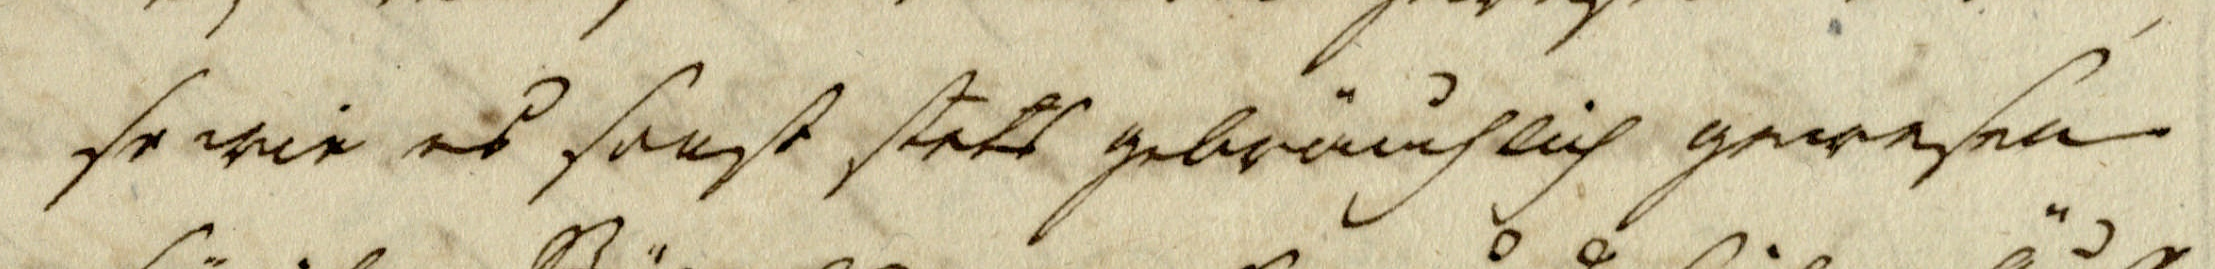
so wie es sonst stets gebräuchlich gewesen
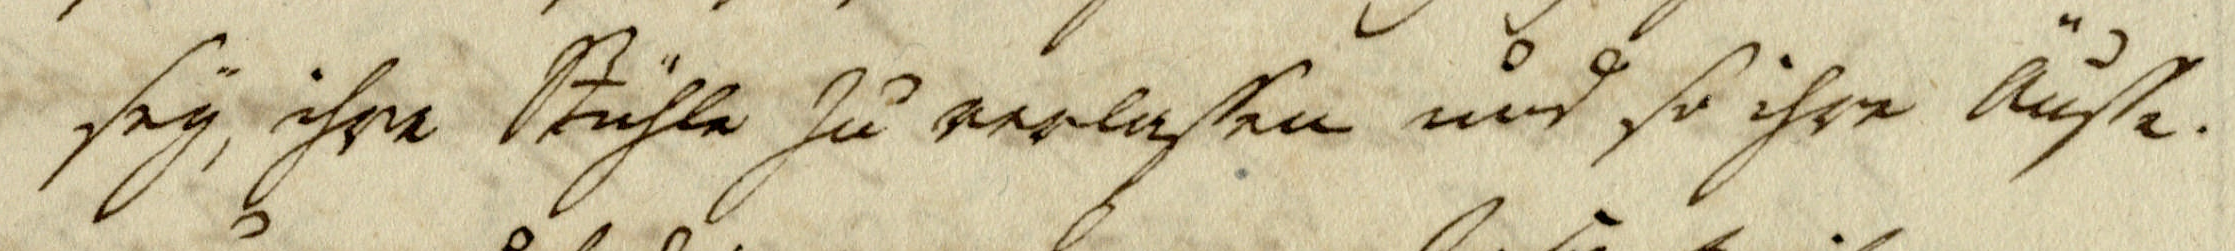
seÿ, ihre Stühle zu verlassen und so ihre Äusse¬
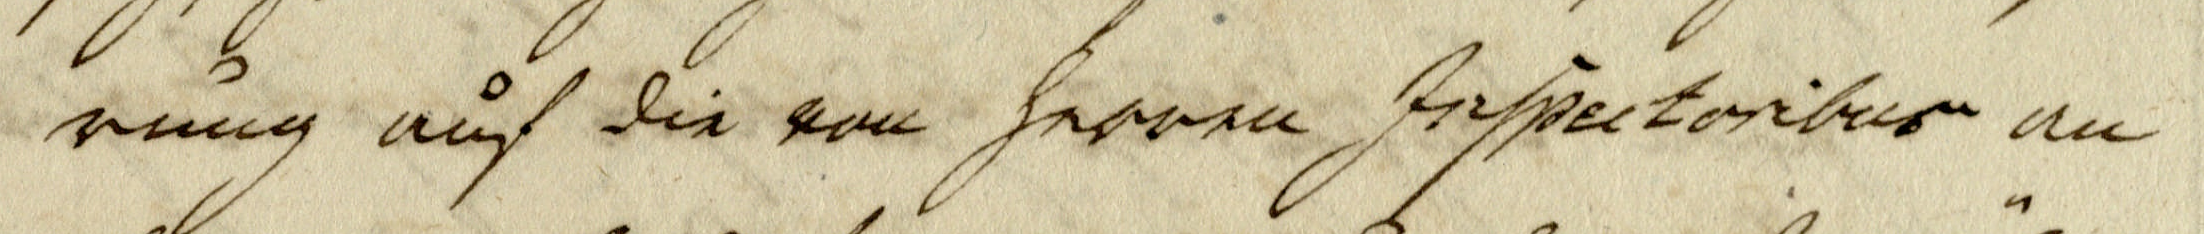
rung auf die von Herren Inspectoribus an
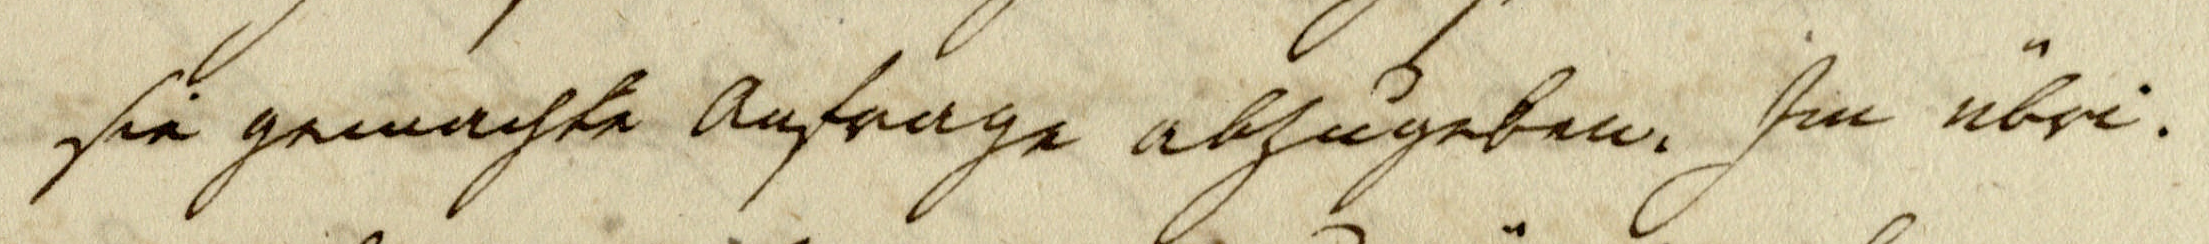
sie gemachte Anfrage abzugeben. Im übri¬
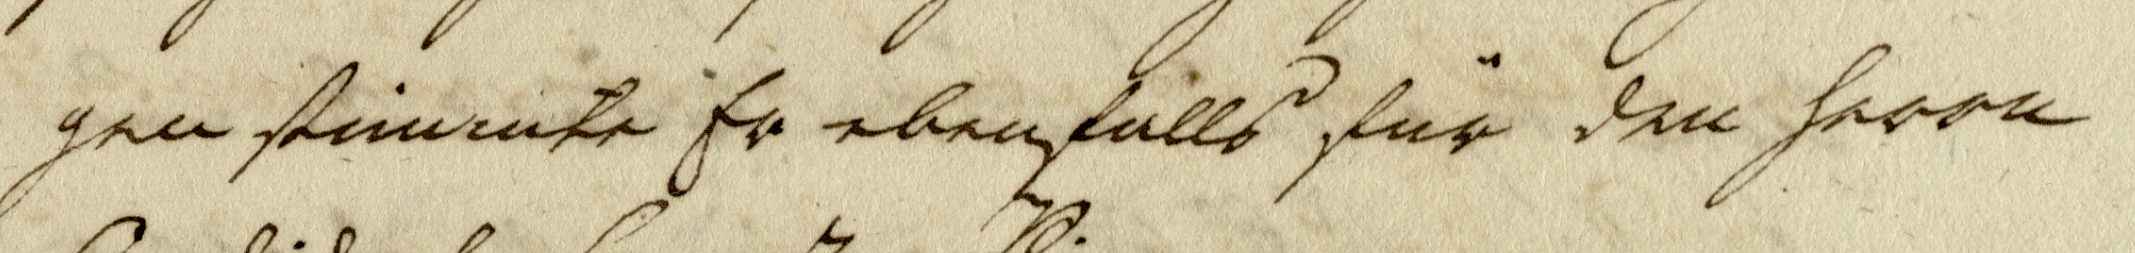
gen stimmte Er ebenfalls für den Herrn
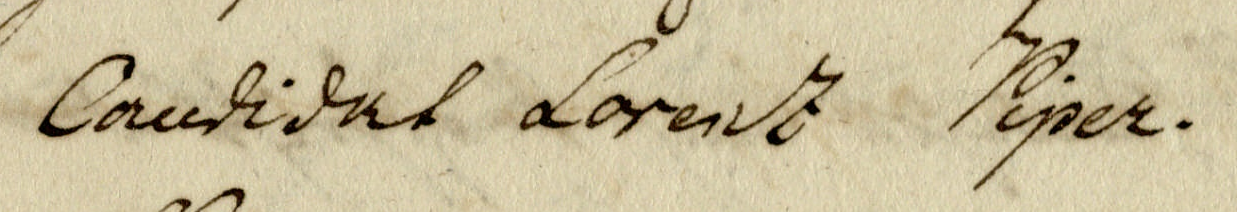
Candidat Lorenz Piper.
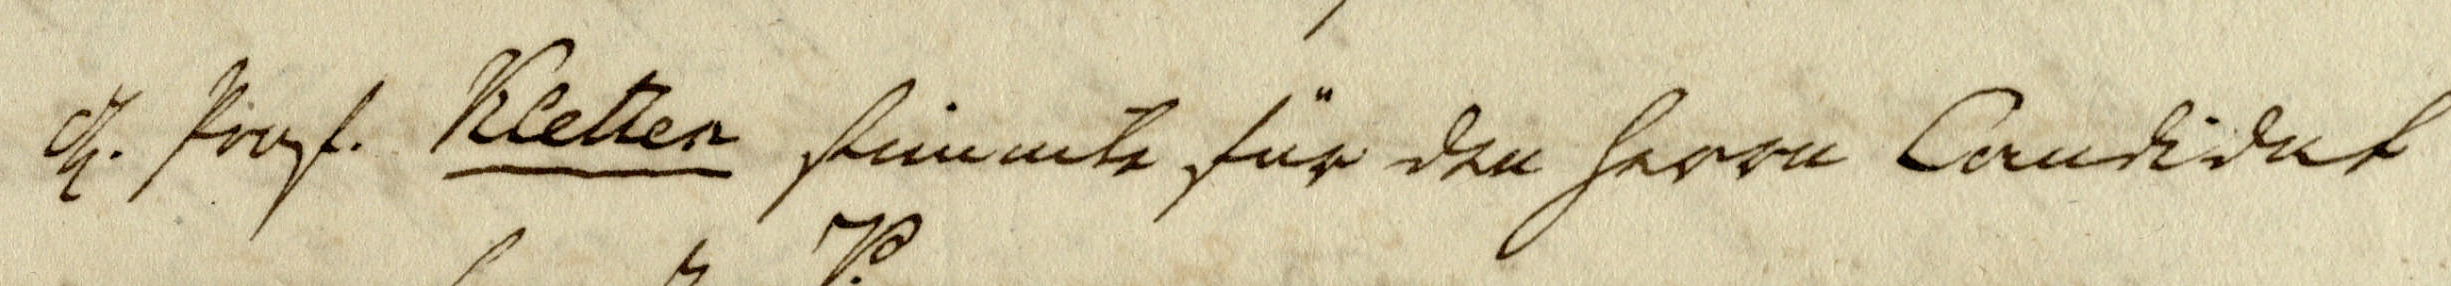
dh. Prof. Kletten stimmte für den Herrn Candidat
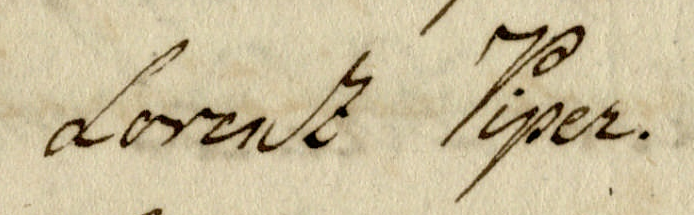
Lorenz Piper.
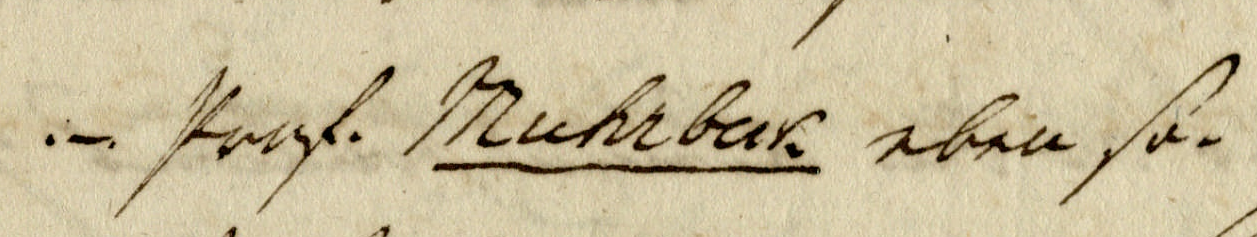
Prof. Muhrbeck eben so.
